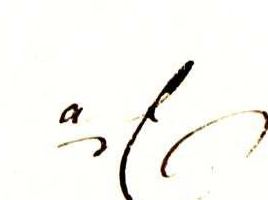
AE
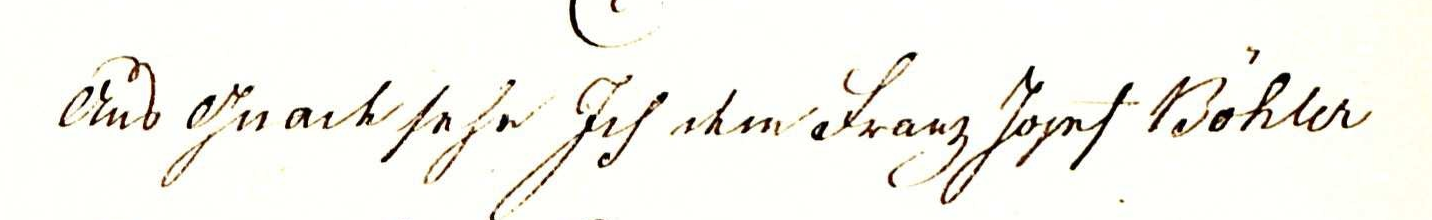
Aus Gnade sehe Ich dem Franz Josef Böhler
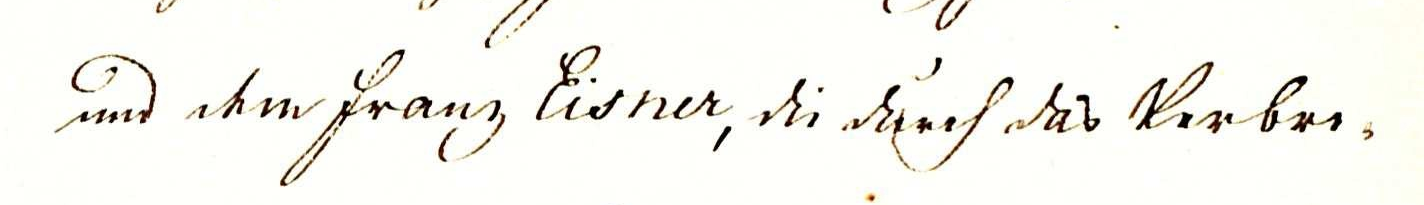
und dem Franz Eisner, die durch das Verbre¬
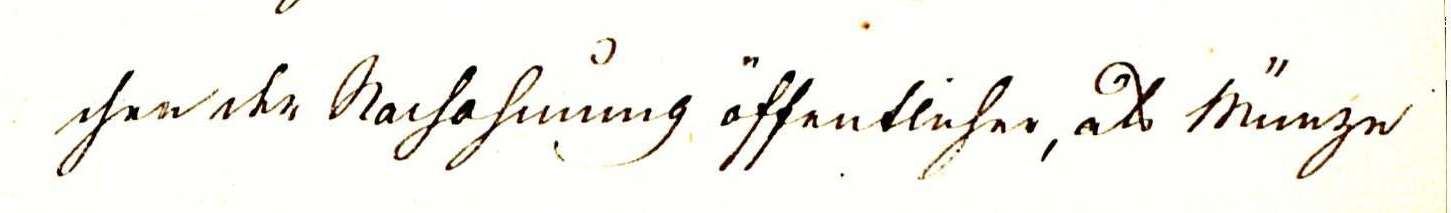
chen der Nachahmung öffentliche, als Münze
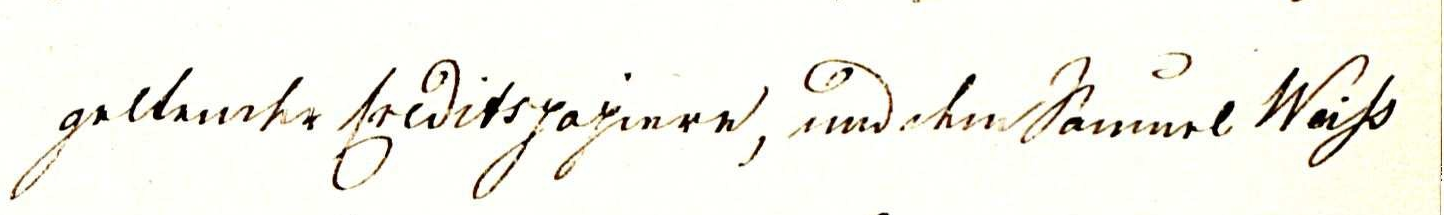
geltender Creditspapiere, und dem Samuel Weiss,
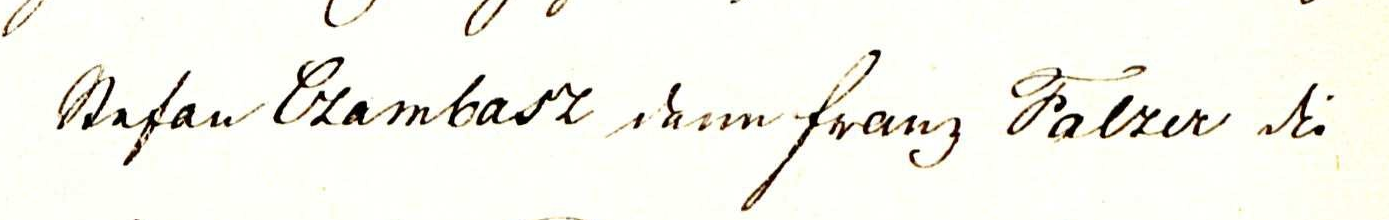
Stefan Czambasz dann Franz Falzer die
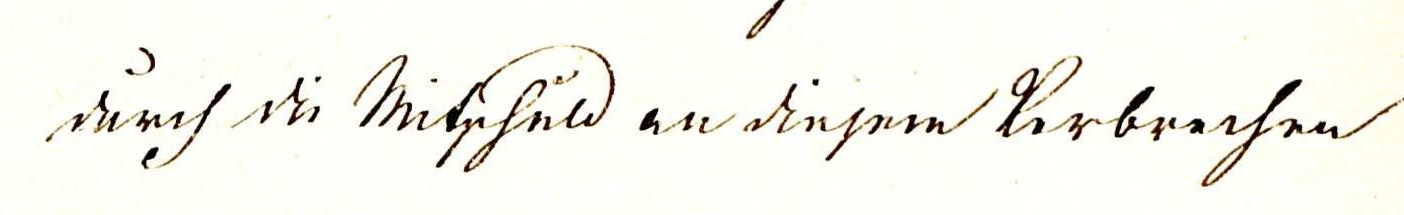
durch die Mitschuld an diesem Verbrechen
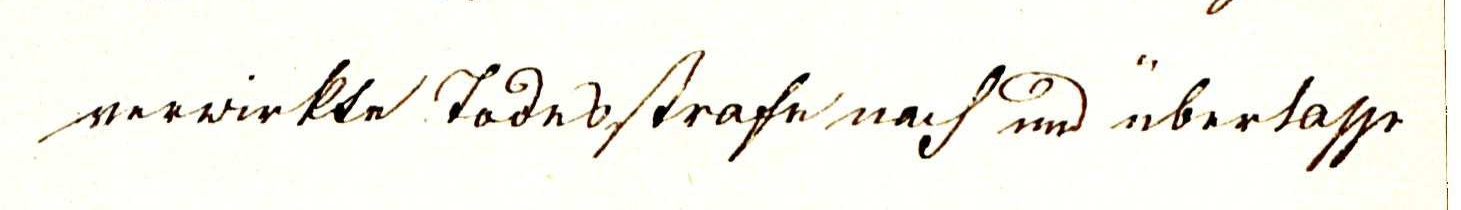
verwirkte Todesstrafe nach und überlasse
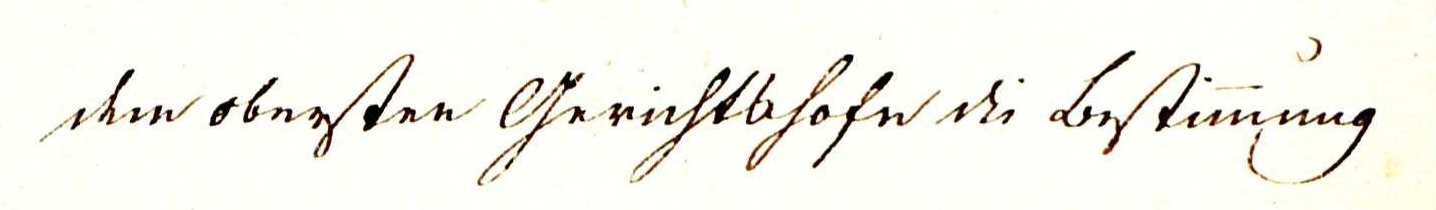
em obersten Gerichtshofe die Bestimmung
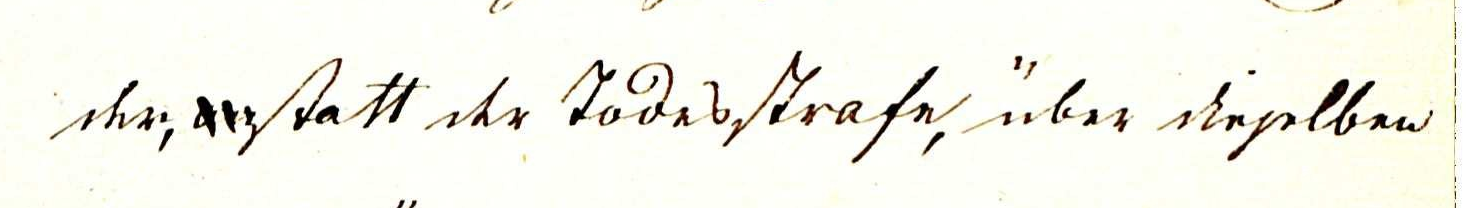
der, statt der Todesstrafe, über dieselben
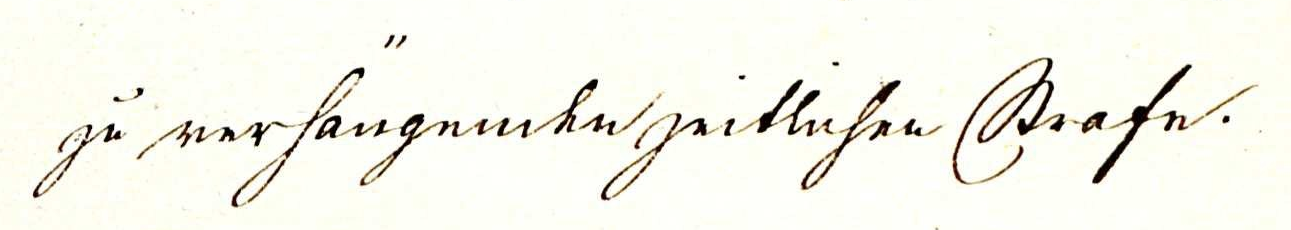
zu verhängende zeitliche Strafe.
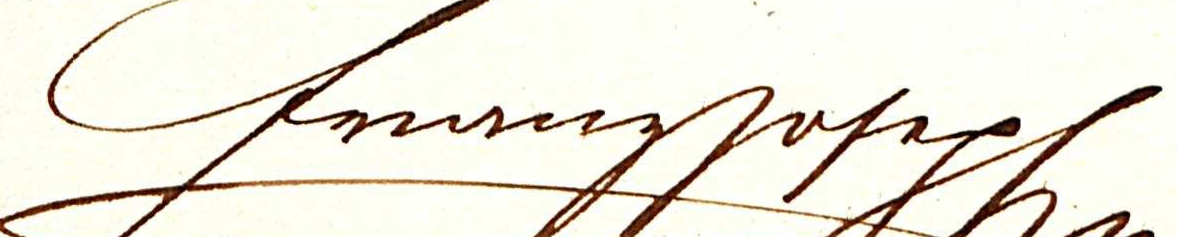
Franz Joseph
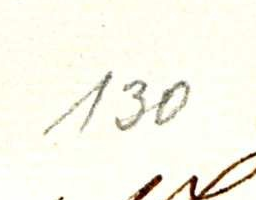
130
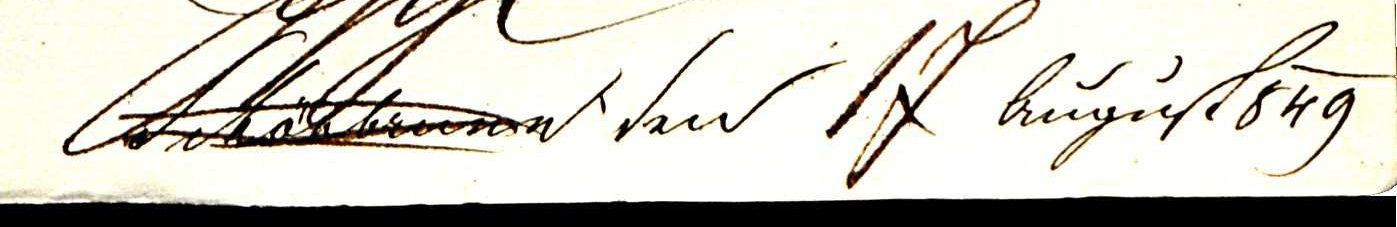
Ischl den 17. August 849
